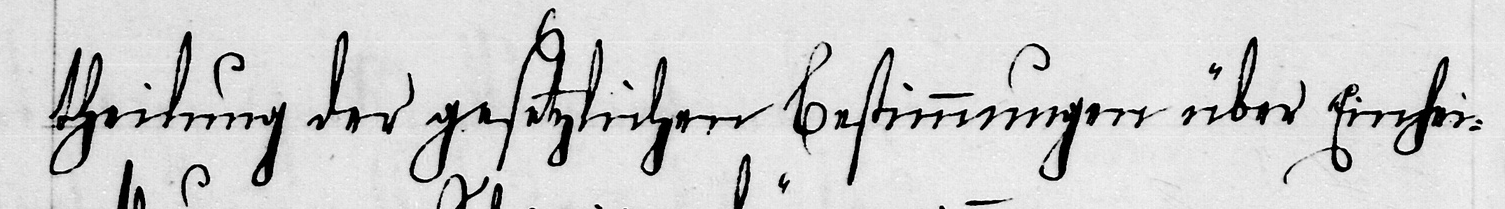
theilung der gesetzlichen Bestimmungen über Einhei¬
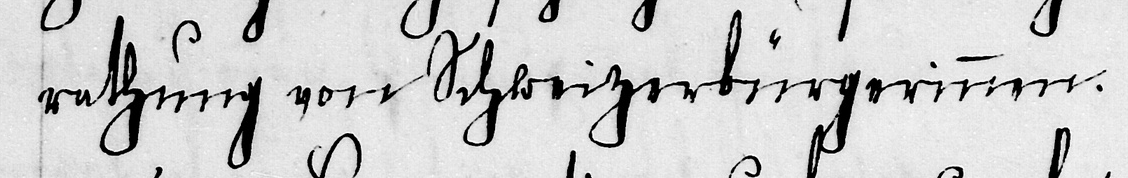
rathung von Schweizerbürgerinnen.
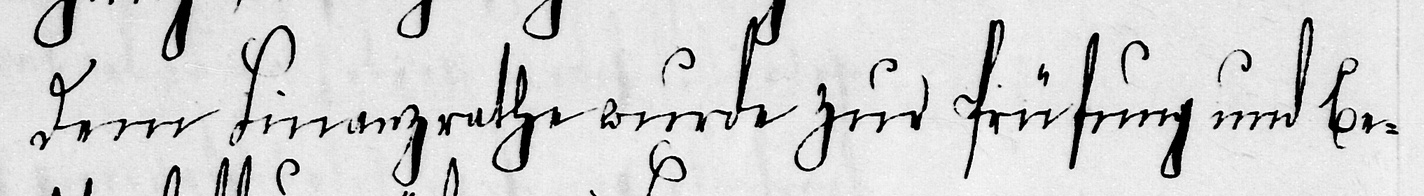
Dem Finanzrathe wurde zur Prüfung und Be¬
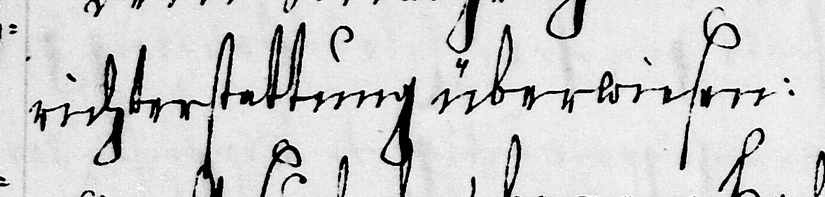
richterstattung überwiesen:
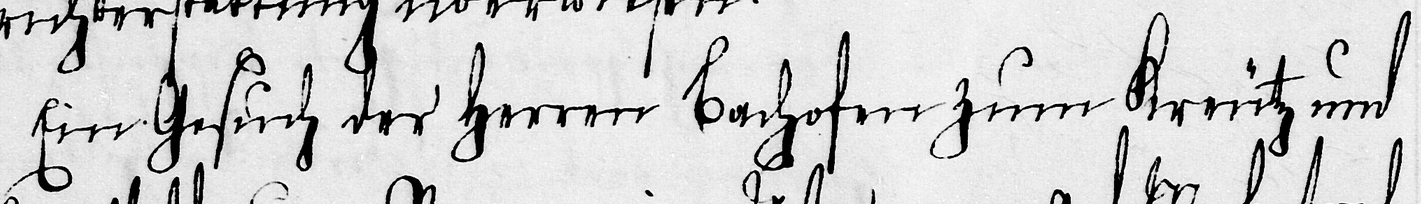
Ein Gesuch der Herren Bachofen zum Kreutz und
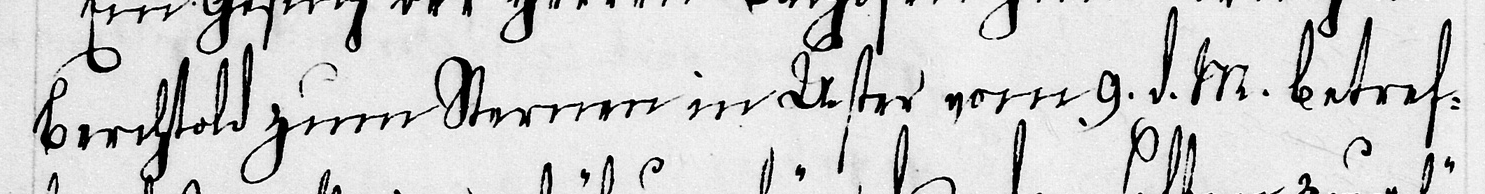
Berchtold zum Sternen in Uster vom 9. d. M. betref¬
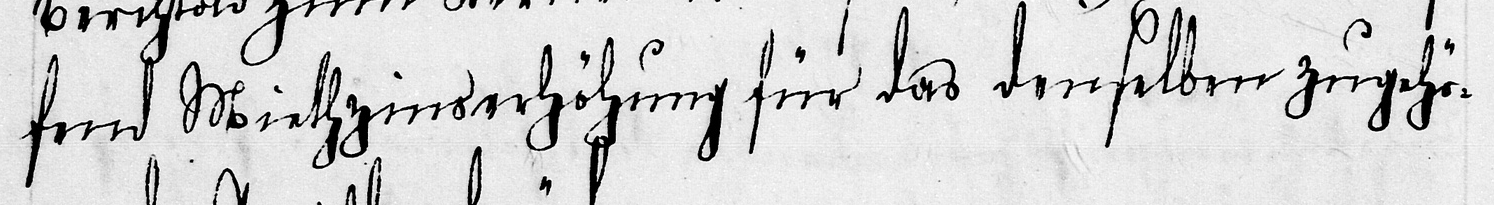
fend Miethzinserhöhung für das denselben zugehö¬
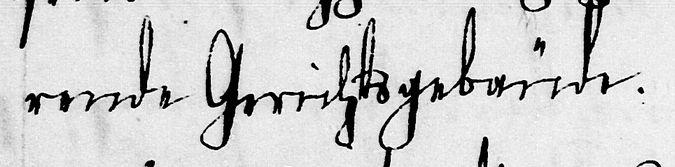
rende Gerichtsgebäude.
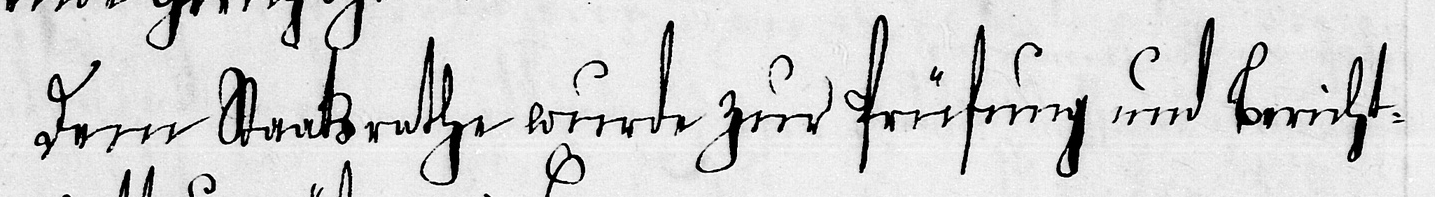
Dem Staatsrathe wurde zur Prüfung und Bericht¬
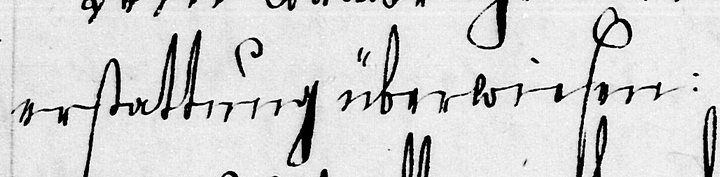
erstattung überwiesen:
